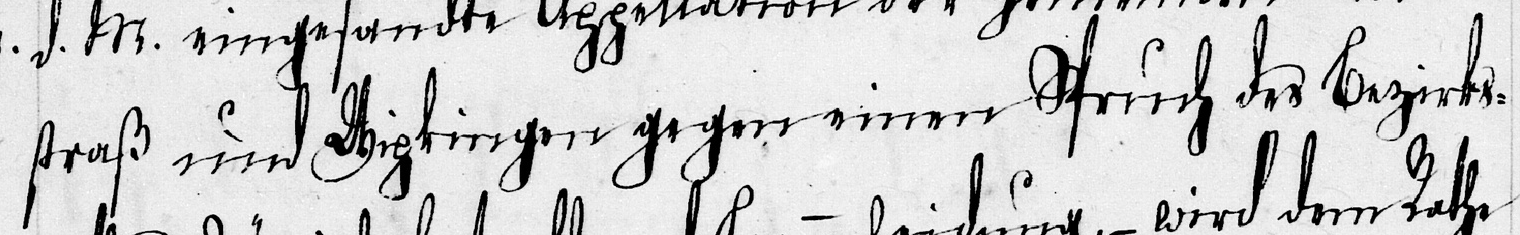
straß und Wipkingen gegen einen Spruch des Bezirks¬
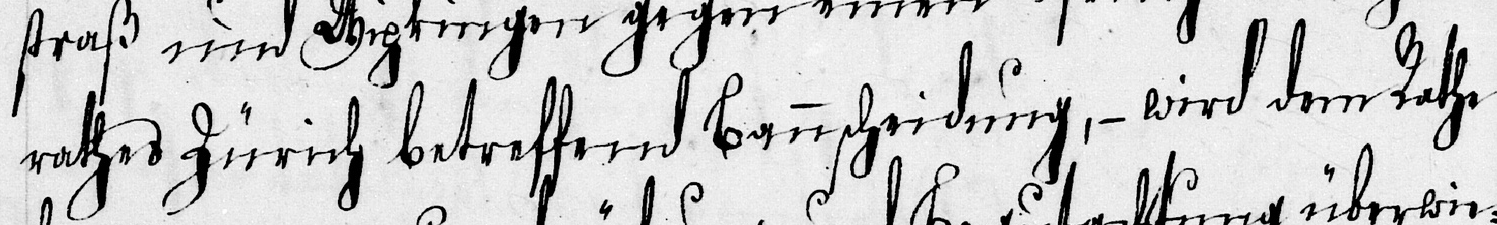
rathes Zürich betreffend Bannscheidung, – wird dem Rathe
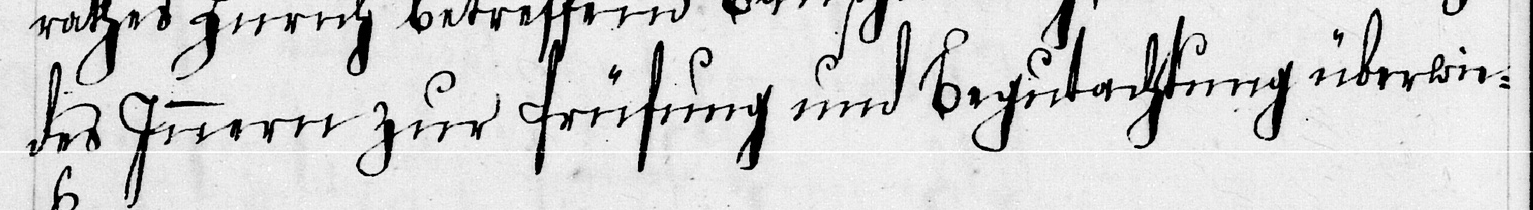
des Innern zur Prüfung und Begutachtung überwie¬
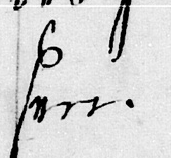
sen.
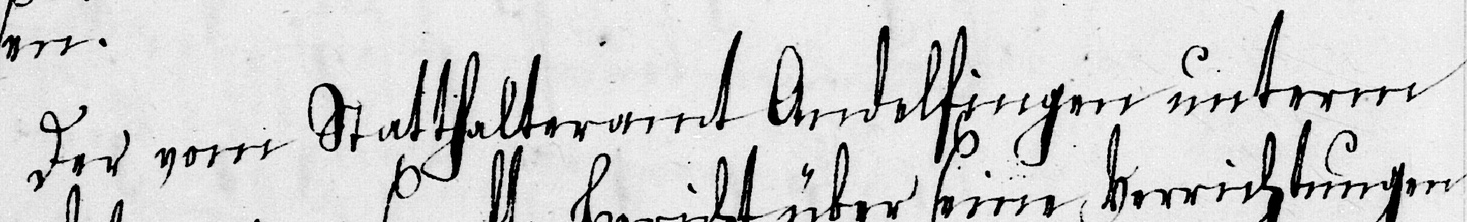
Der vom Statthalteramt Andelfingen unterm
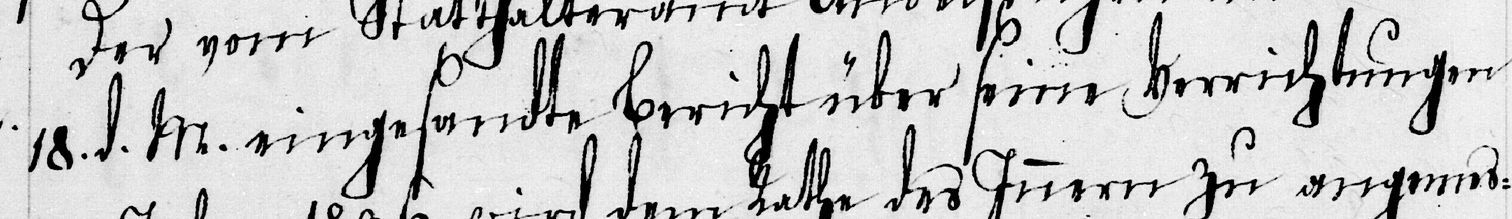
18. d. M. eingesandte Bericht über seine Verrichtungen
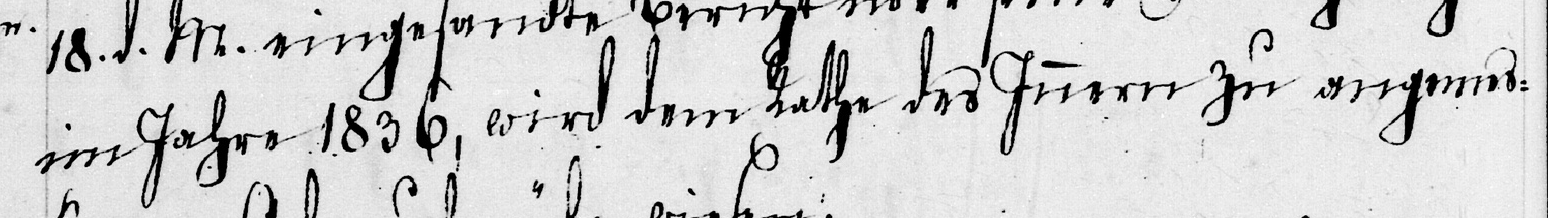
im Jahre 1836, wird dem Rathe des Innern zu angemeß¬
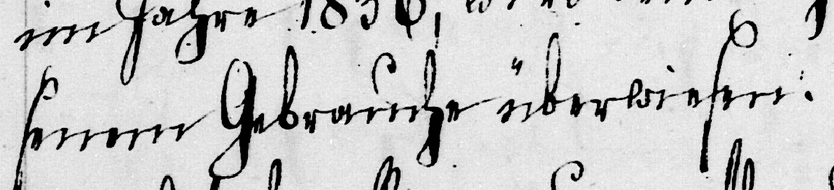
enem Gebrauche überwiesen.
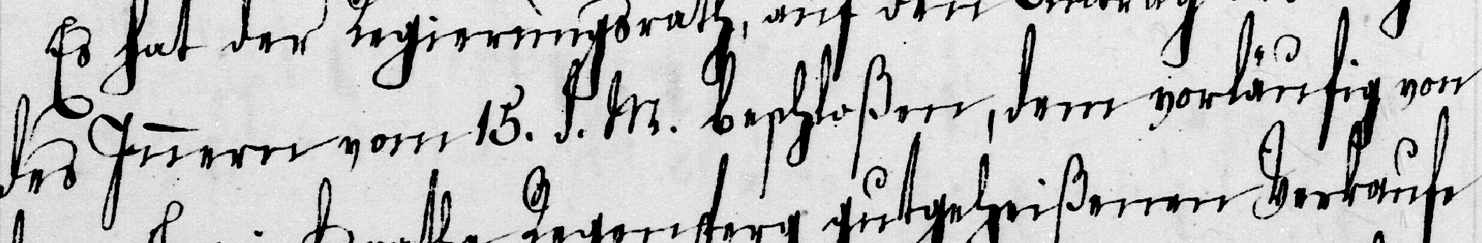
des Innern vom 15. d. M. beschloßen, dem vorläufig von
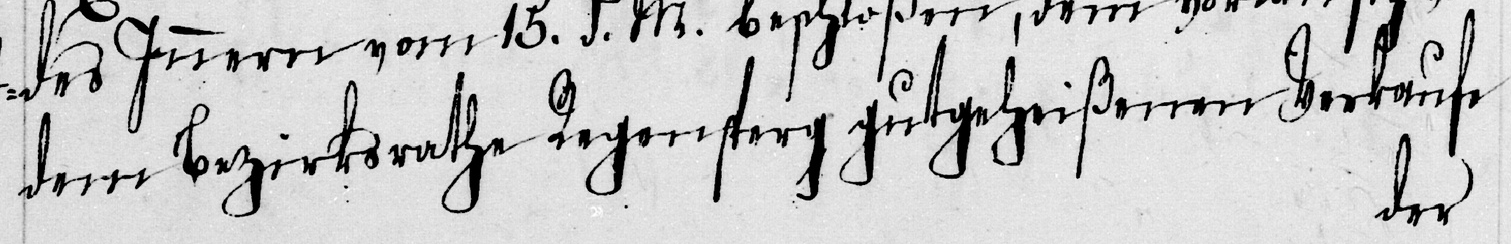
dem Bezirksrathe Regensperg gutgeheißenen Verkaufe
